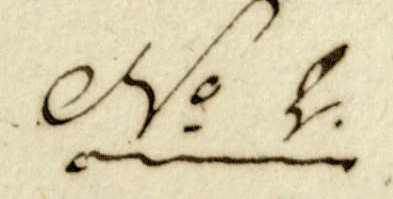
Nº 2.
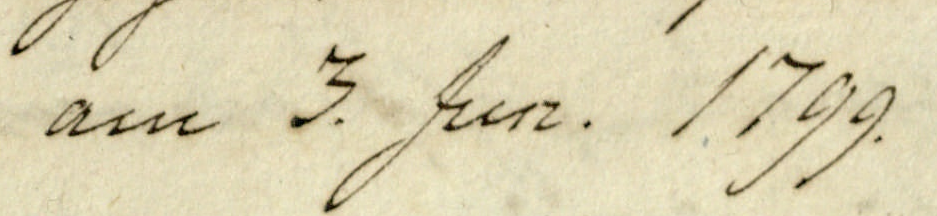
am 3. Jun. 1799.
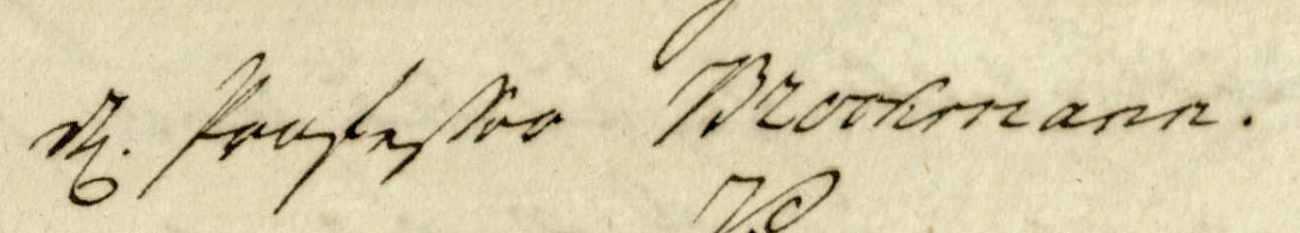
dh. Professor Brockmann.
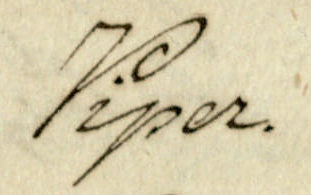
Piper.
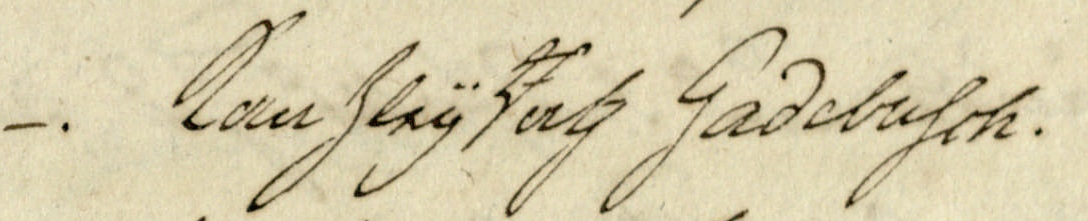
Kanzleÿ Rath Gadebusch.
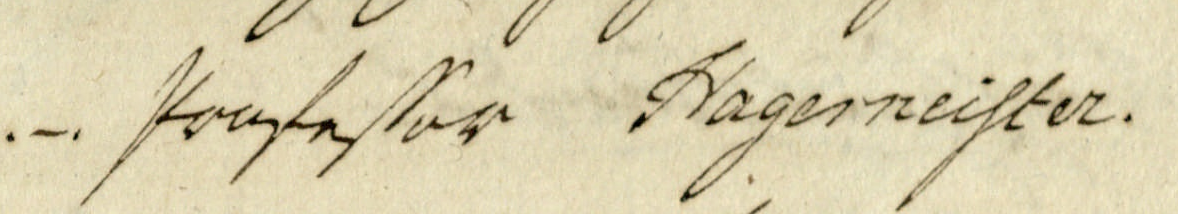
Professor Hagemeister.
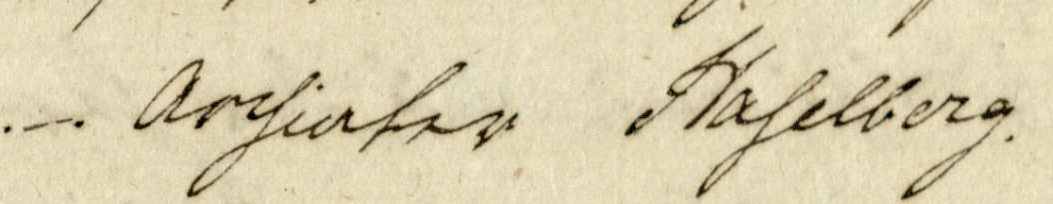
Archiater Haselberg.
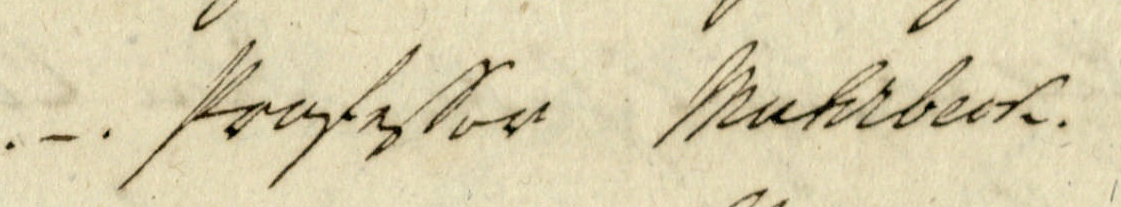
Professor Muhrbeck.
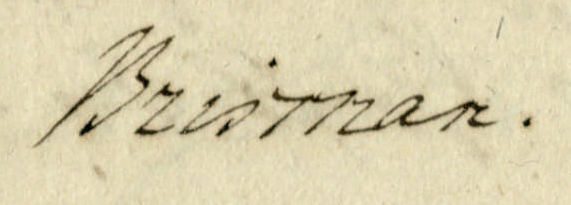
Brisman.
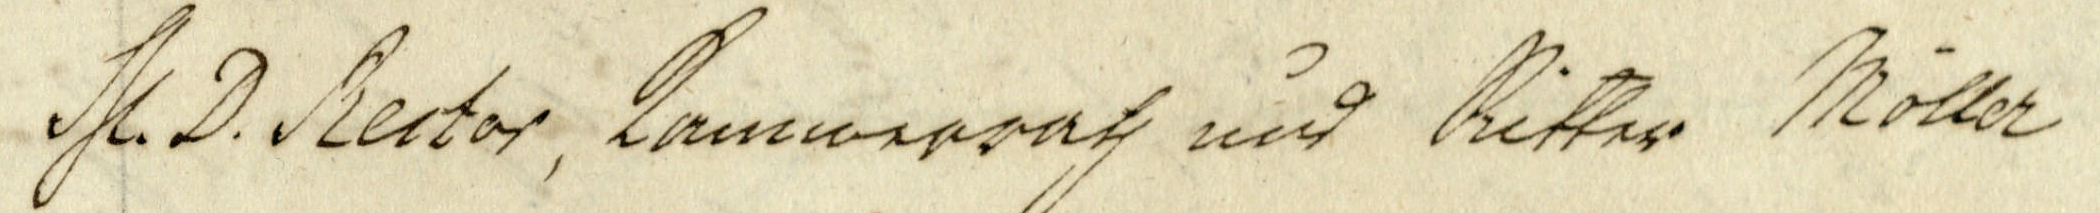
M. D. Rector, Kammerrath und Ritter Möller
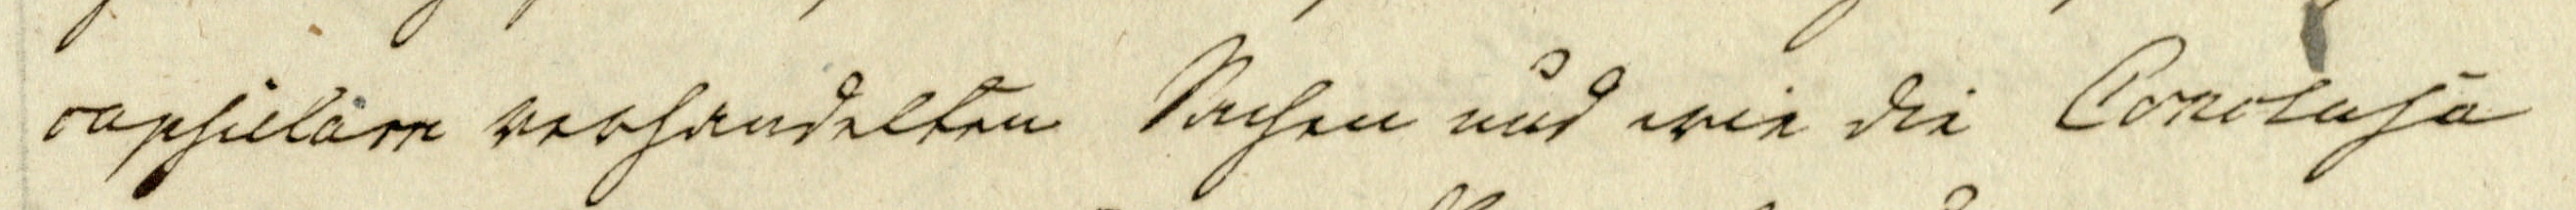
capsulam verhandelten Sachen und wie die Conclusä
